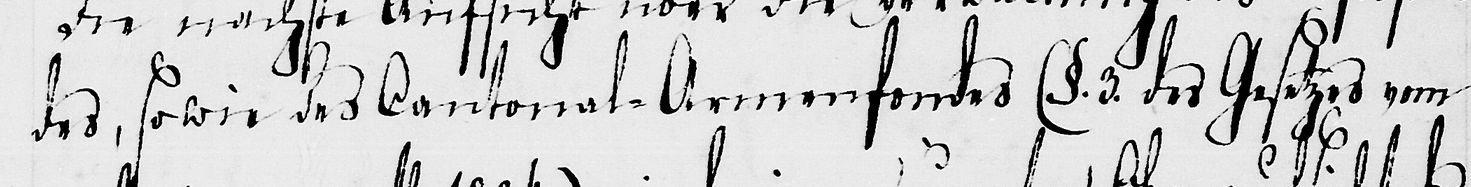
des, sowie des Cantonal-Armenfondes (§. 3. des Gesetzes vom
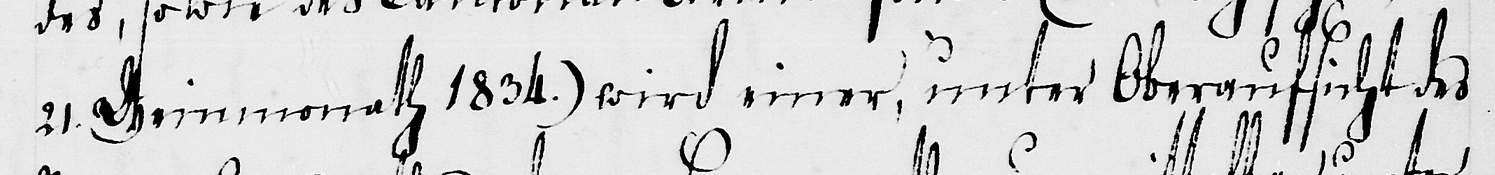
21. Weinmonath 1834. ) wird einer, unter Oberaufsicht des
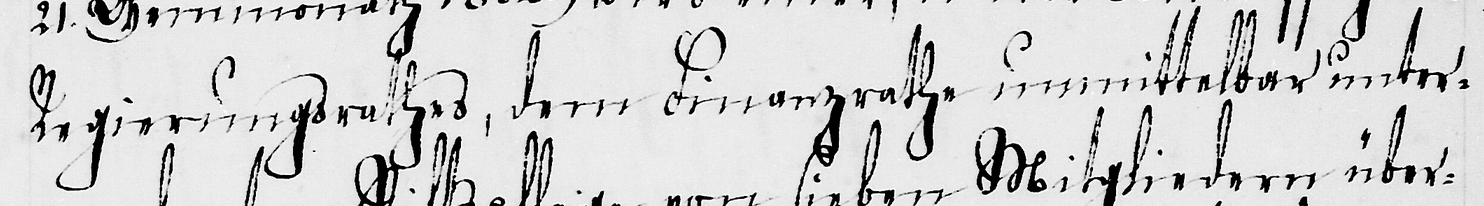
Regierungsrathes, dem Finanzrathe unmittelbar unter¬
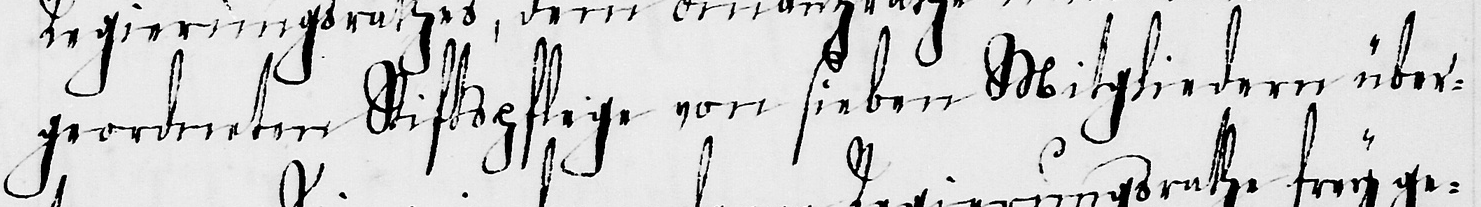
geordneten Stiftspflege von sieben Mitgliedern über¬
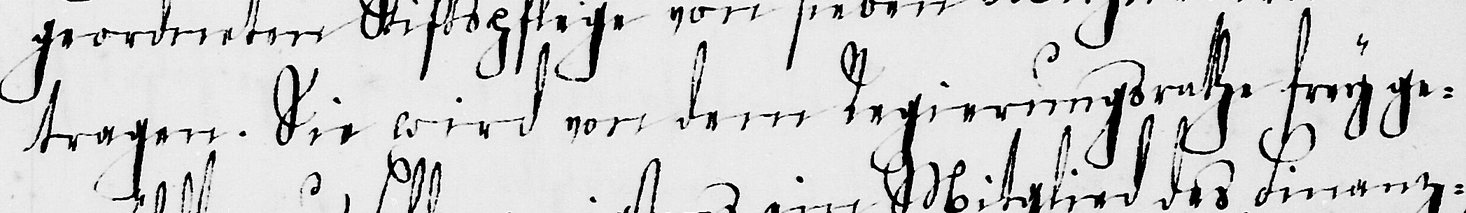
tragen. Sie wird von dem Regierungsrathe frey ge¬
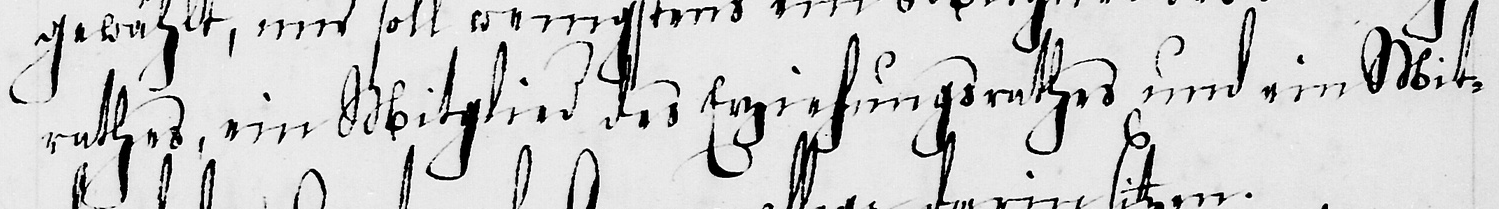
rathes, ein Mitglied des Erziehungsrathes und ein Mit¬
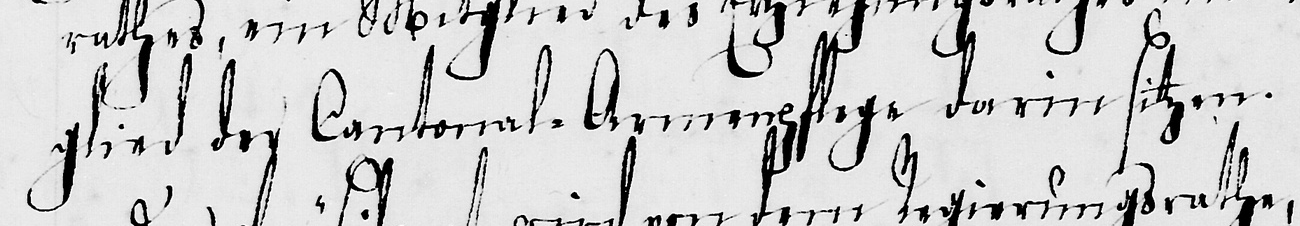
glied der Cantonal-Armenpflege darin sitzen.
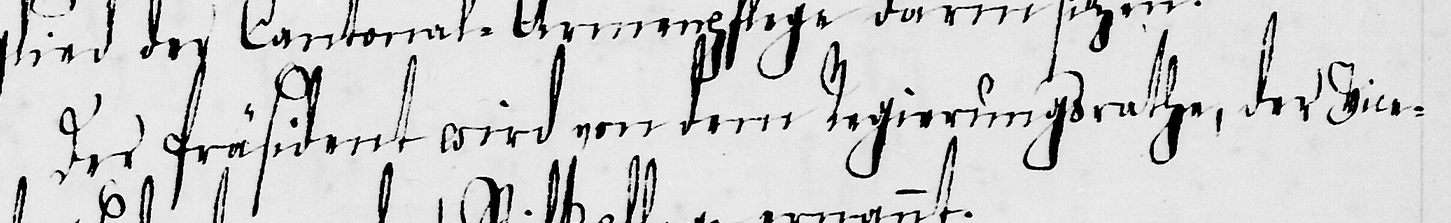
Der Präsident wird von dem Regierungsrathe, der Vic¬
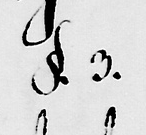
§. 3.
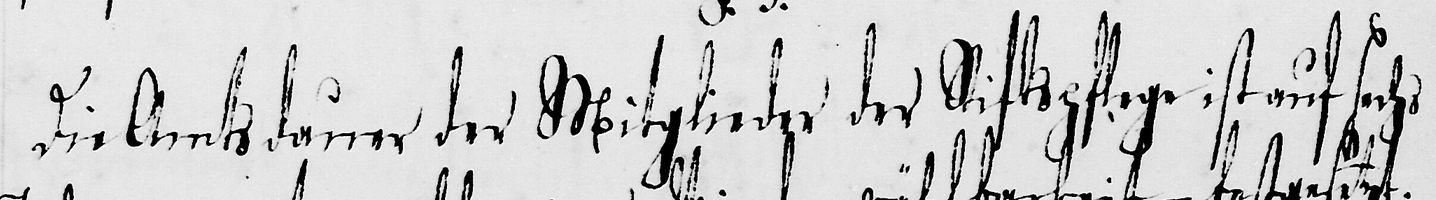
Die Amtsdauer der Mitglieder der Stiftspflege
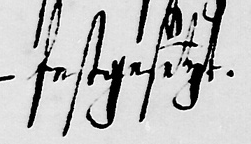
festgesetz¬
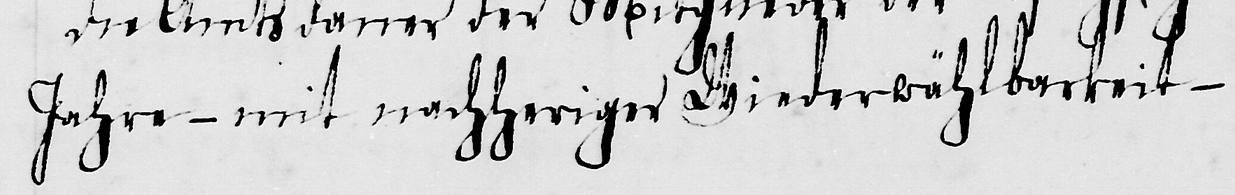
Jahre – mit nachheriger Wiederwählbarkeit –
